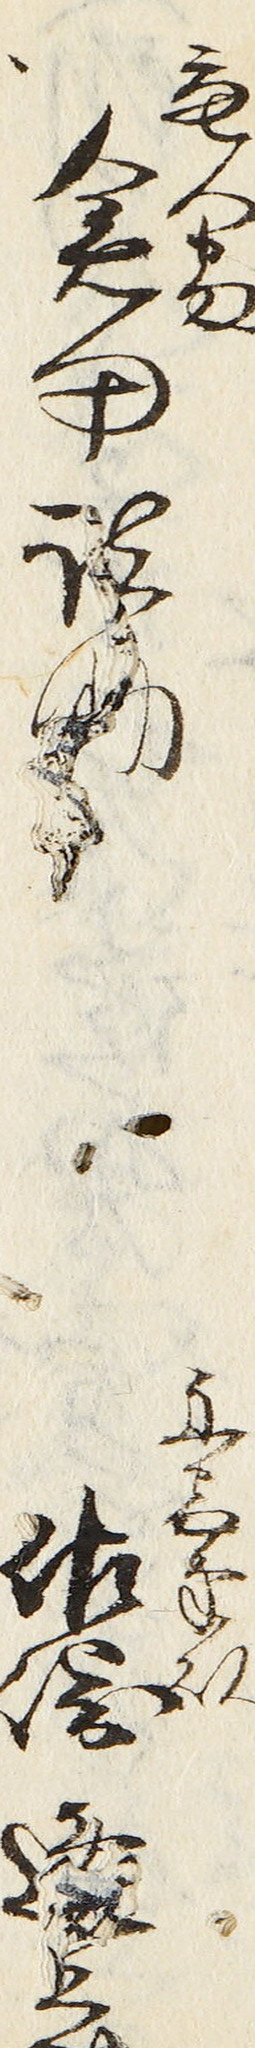倉田諸助佐崎逸平
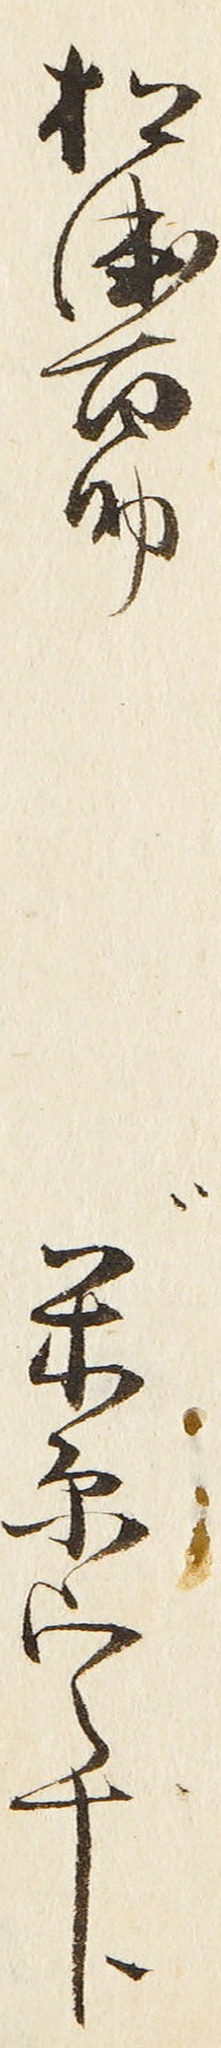松浦百助米原宇十郎
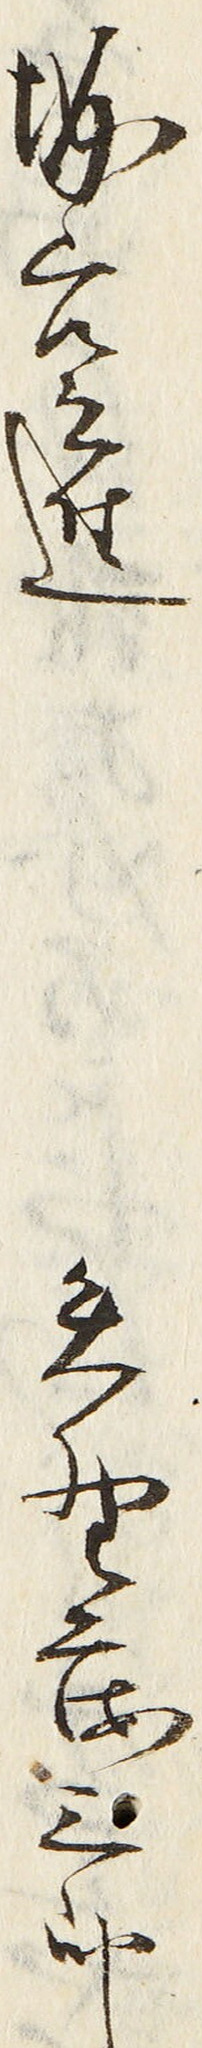城善之進矢野茂三郎

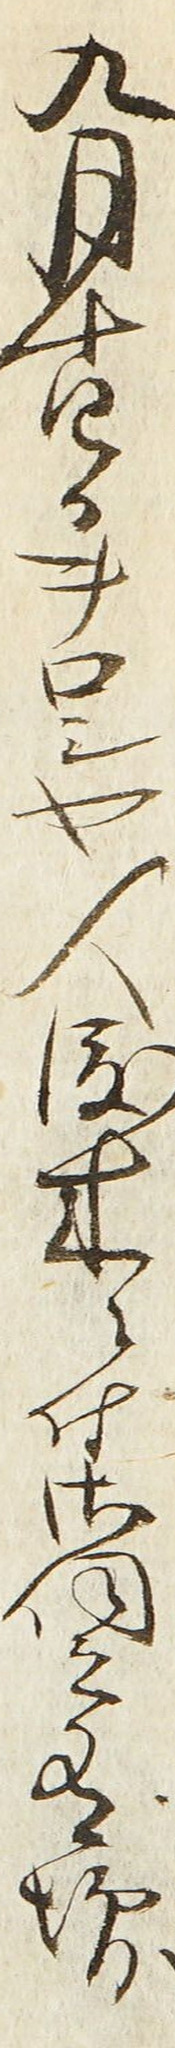九月十四日ヲロシヤ人渡来に付御伺公有増
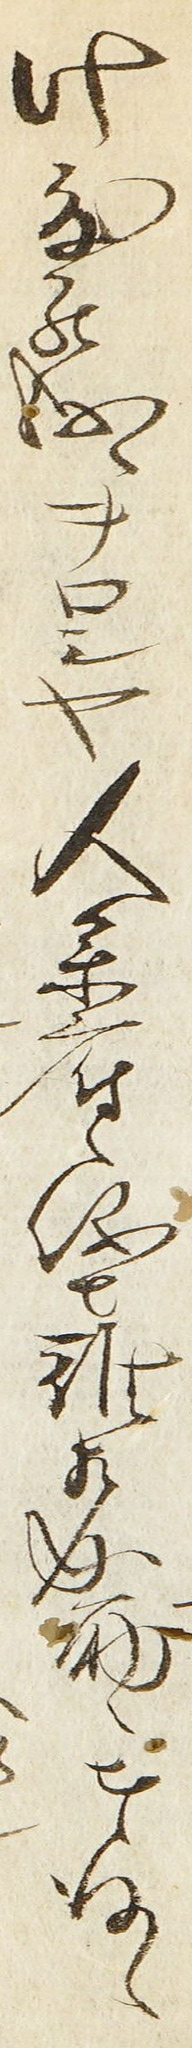此度罷渡候ヲロシヤ人参府之儀は難相成筋へ奉存候
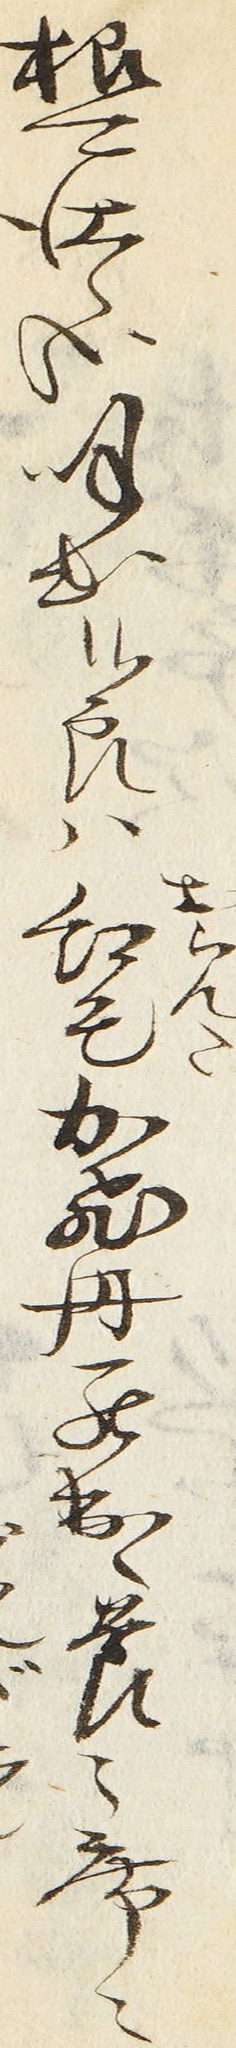様可仕哉呼出候節は紅毛加飛丹罷出候節之席に
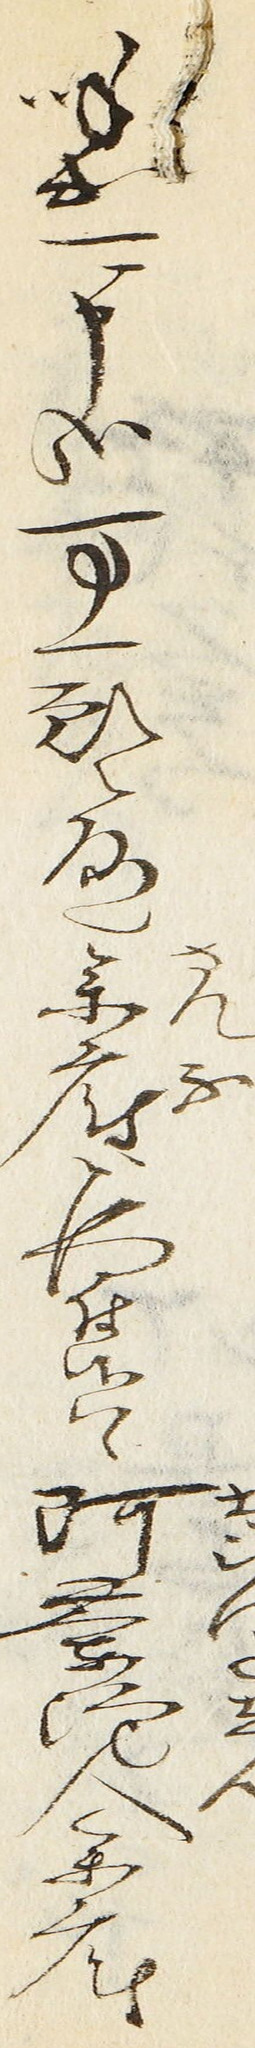呼出可申哉万一願之通参府被仰付候はゝ阿蘭陀人参府
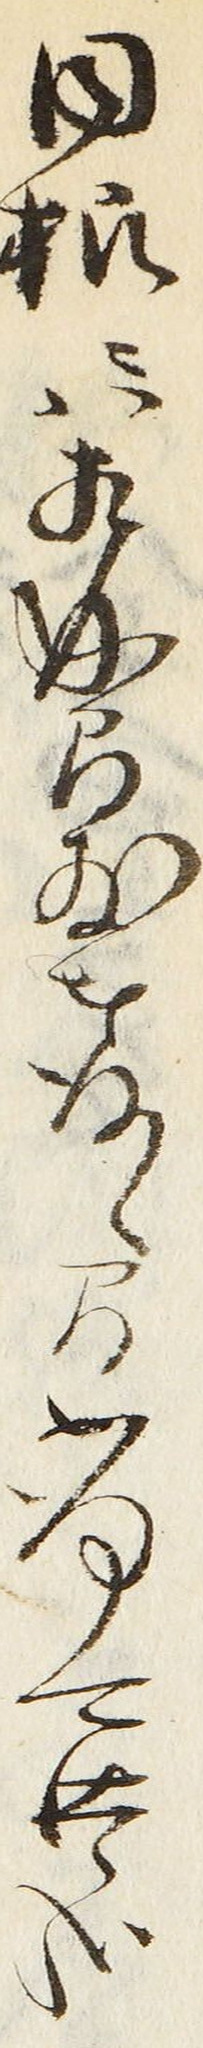同様には相成間敷奉存候間如何可仕候哉
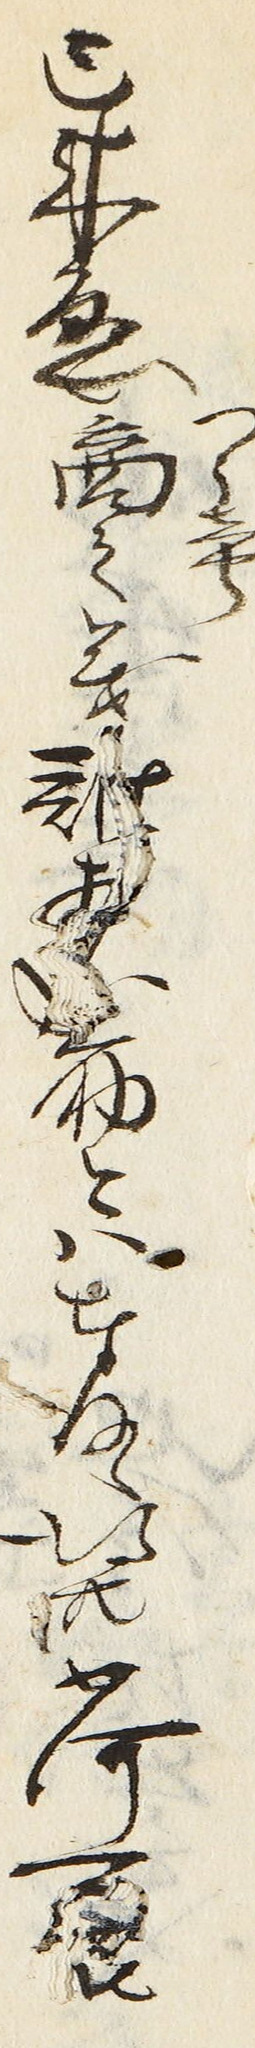以来通商之義難相成筋とは奉存候得共如何可被
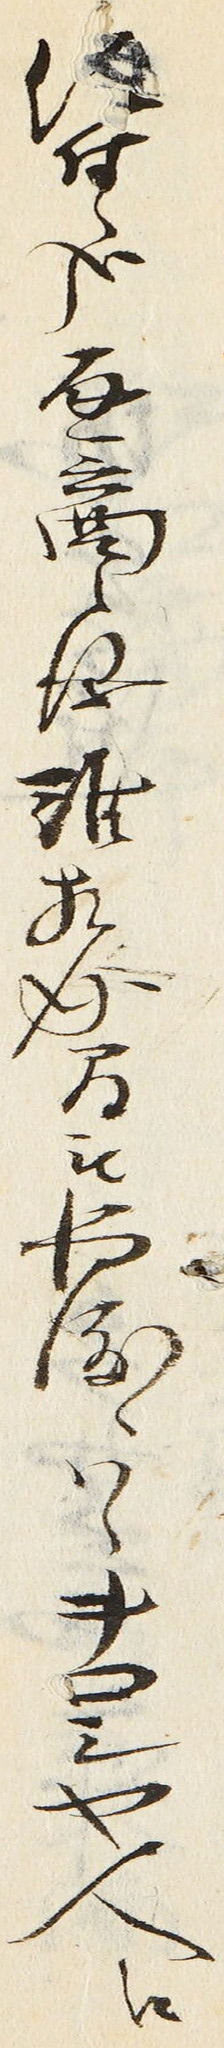仰付候哉通商之儀難相成間被仰渡候はゝヲロシヤ人え
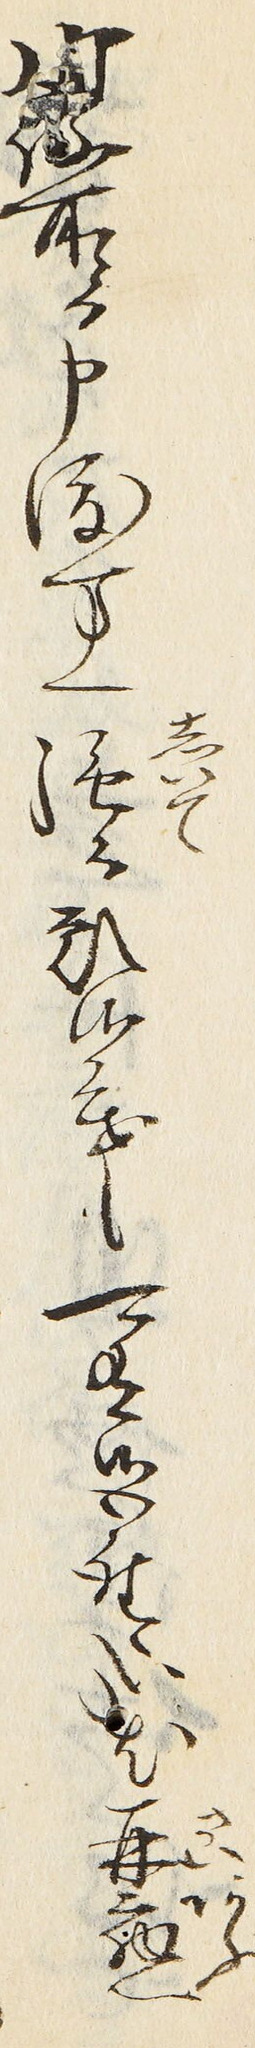御役所にて申渡万一強て願候義も可有候御座候哉尤再応
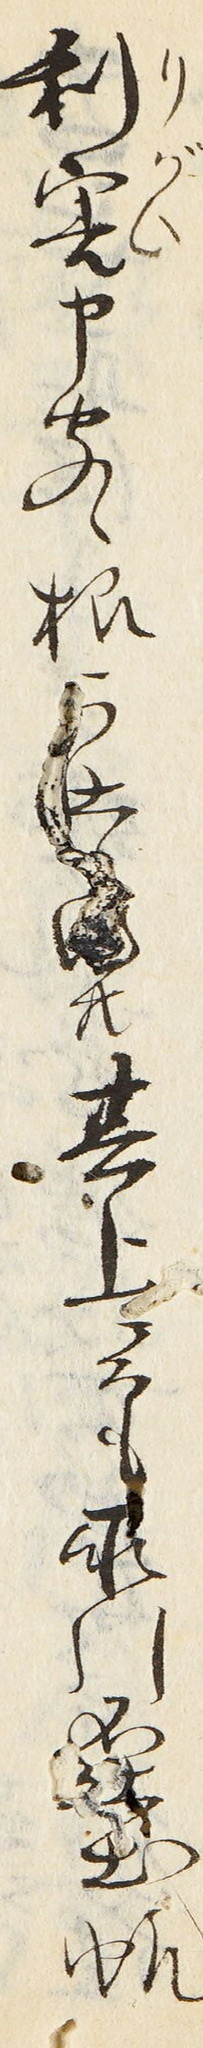利害申聞候様可仕候得共其上にても承引不仕出帆
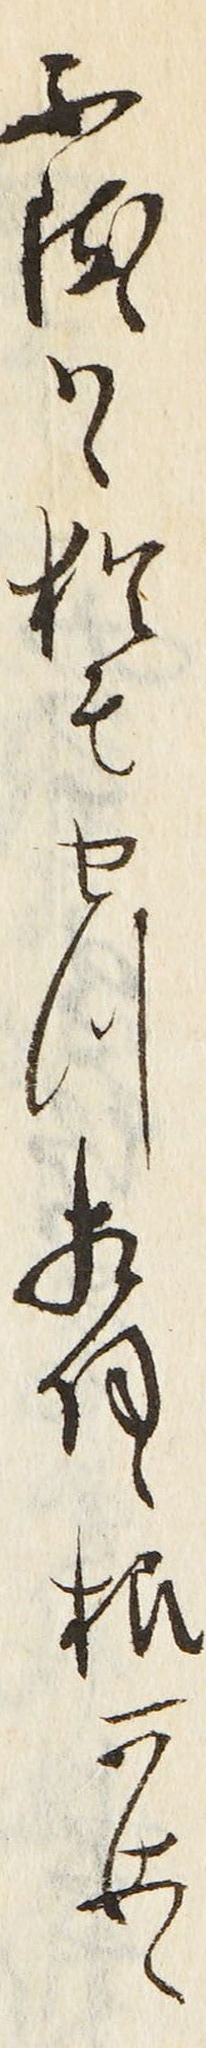不致候はゝ猶其せつ相伺候様可仕候
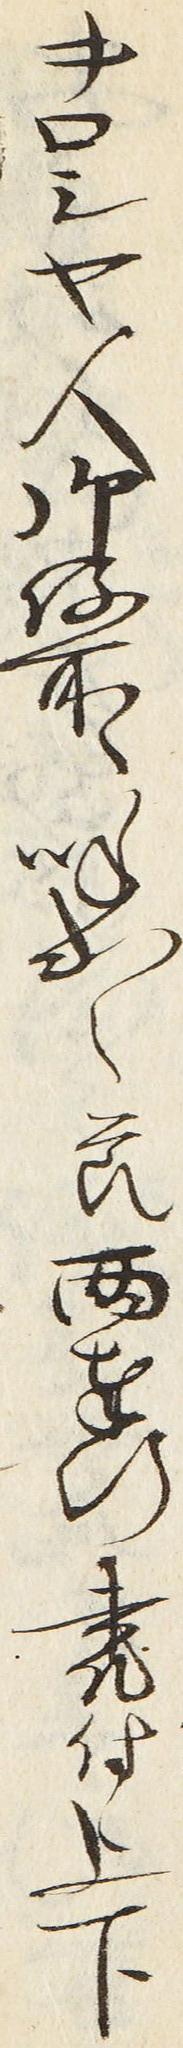ヲロシヤ人御役所へ呼出之節両奉行裏付上下
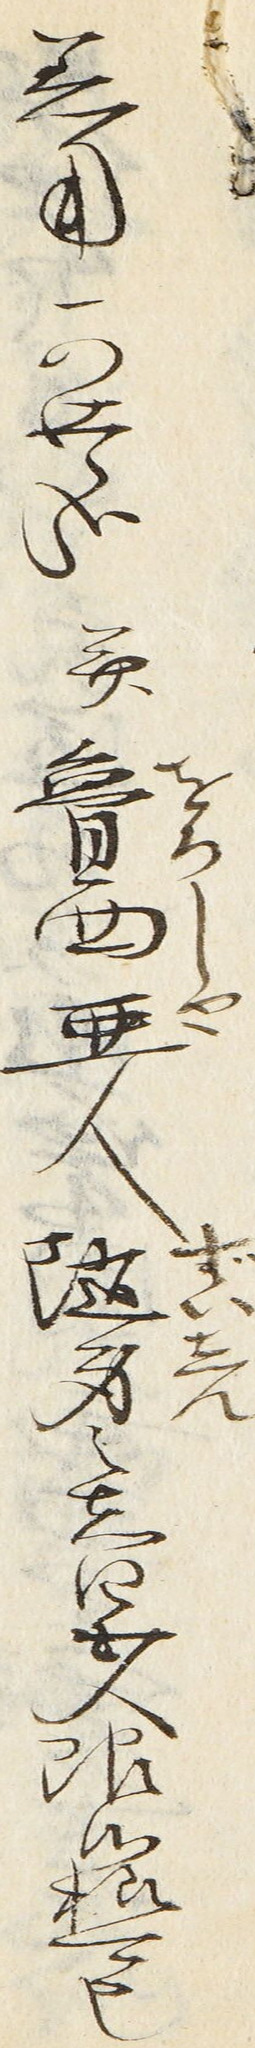着用可仕候哉幷魯西亜人隋身之者四五人限候様可申
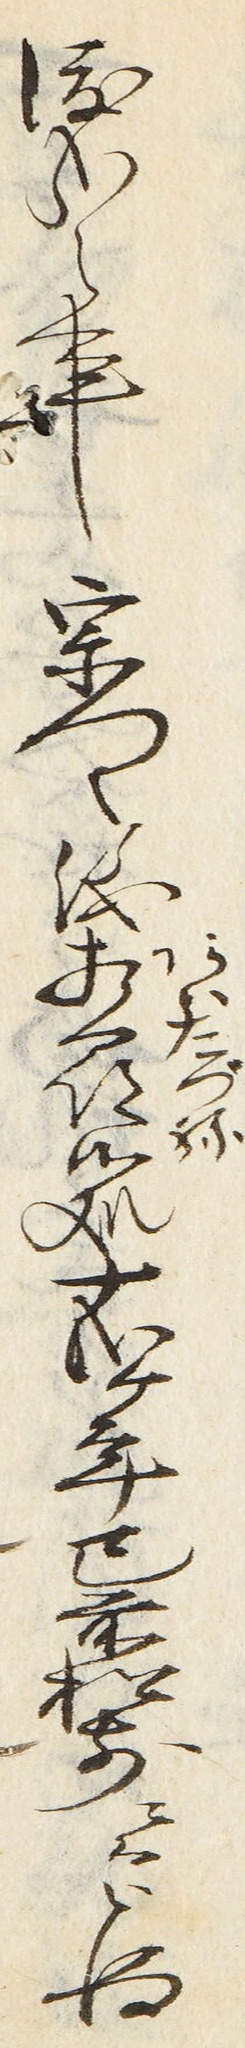渡哉之事宗門之儀相尋候処十弐ヶ年已前松前にて被仰
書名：魯西亜国舟渡来始末并日本流漂人異国遍歴之話（西洋欧羅巴州之内一）
